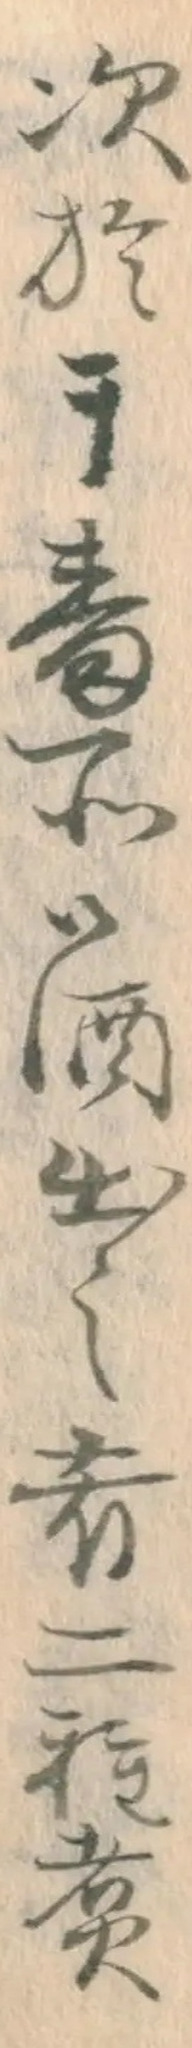次於于番所御酒出之肴二種煮
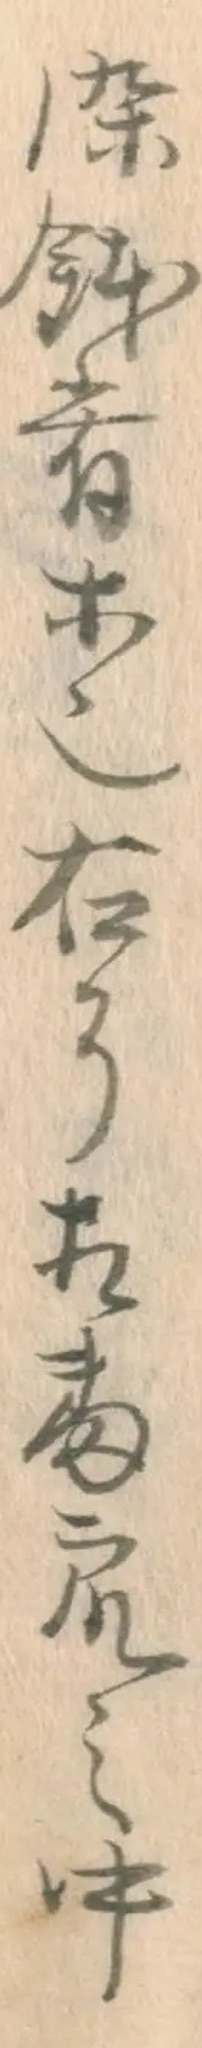染鉢肴等也右了相番衆之中
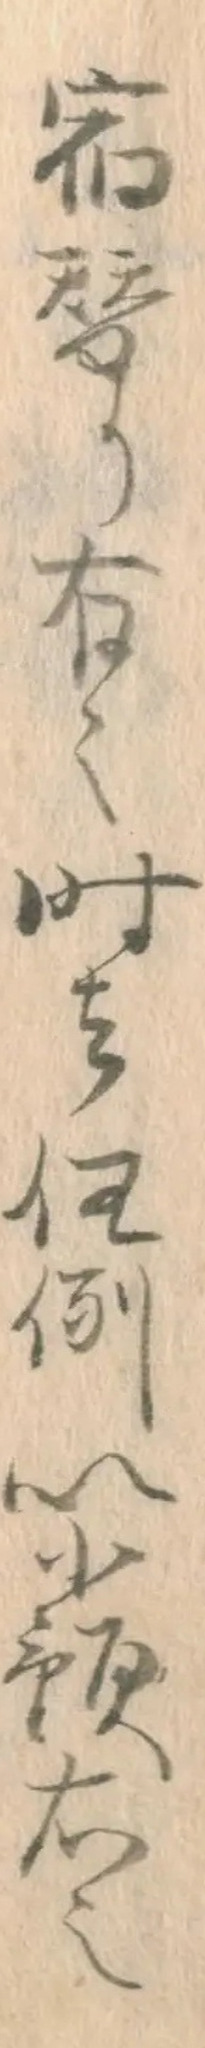宿替リ有之時は任例以小預右之
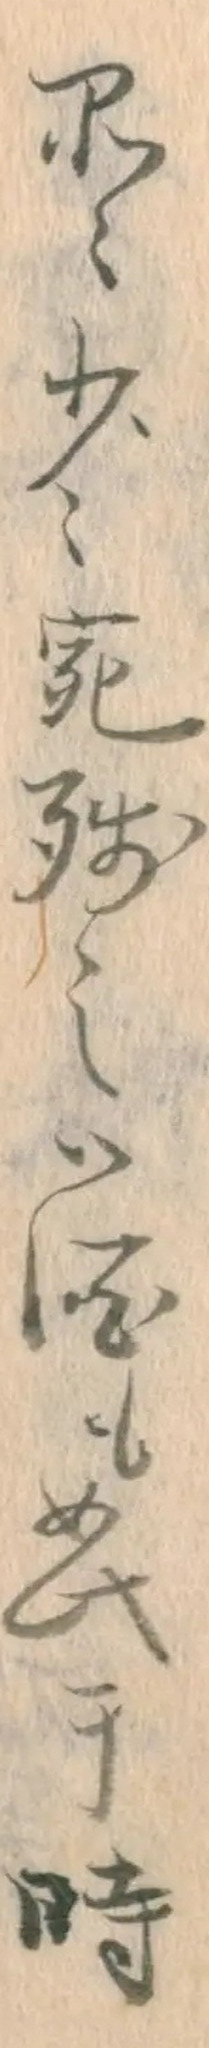品々少々宛残之御酒も如此于時
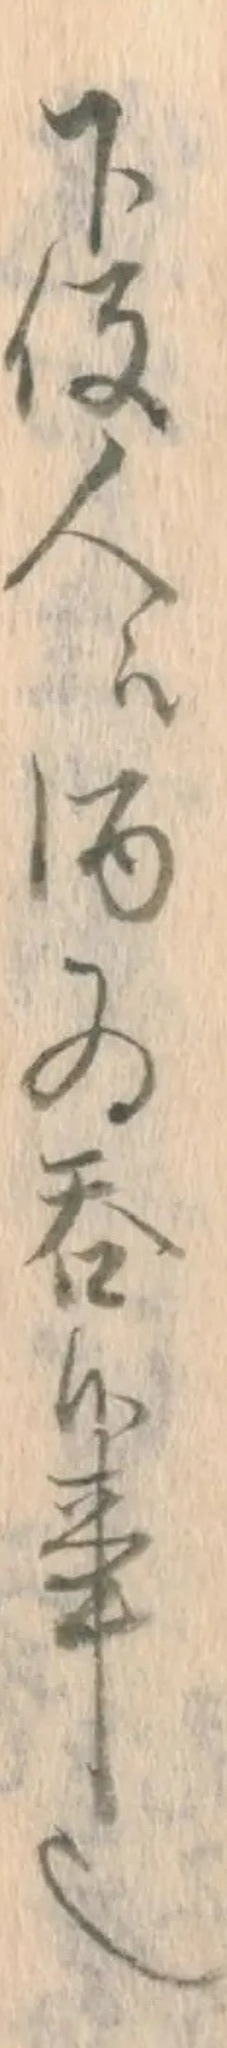下役人え酒為呑候事也
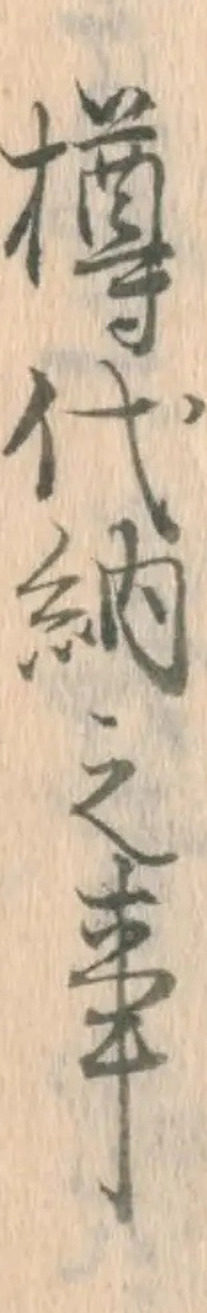樽代納之事
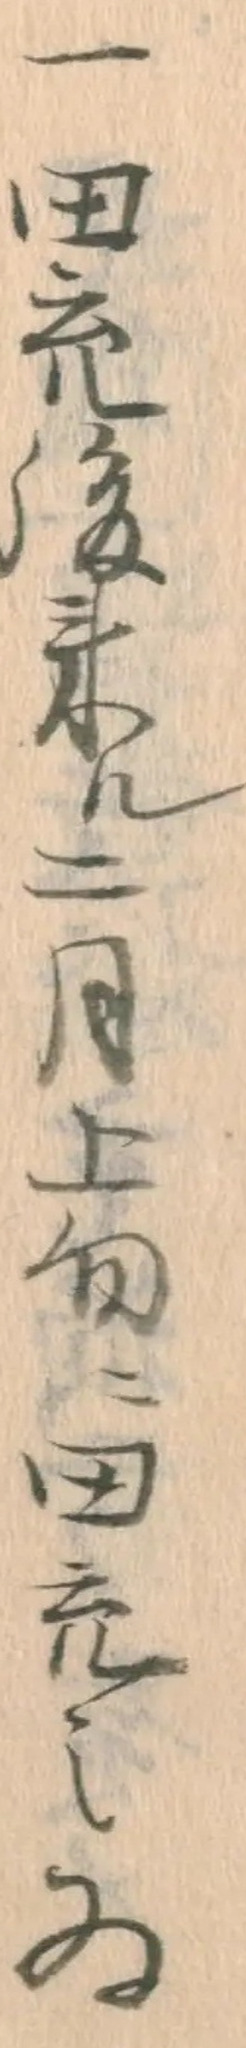一田充後来ル二月上旬ニ田充之為
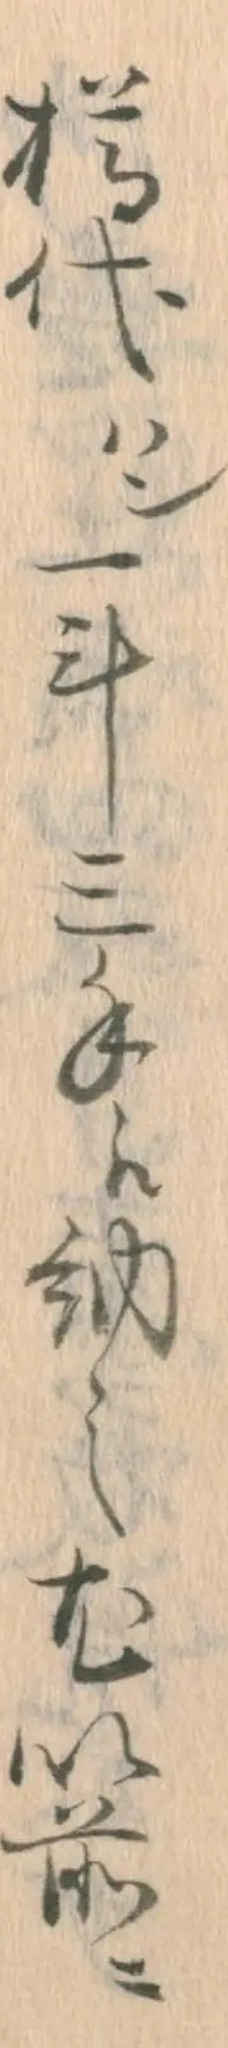樽代ハン一斗三手え納之尤以前ニ
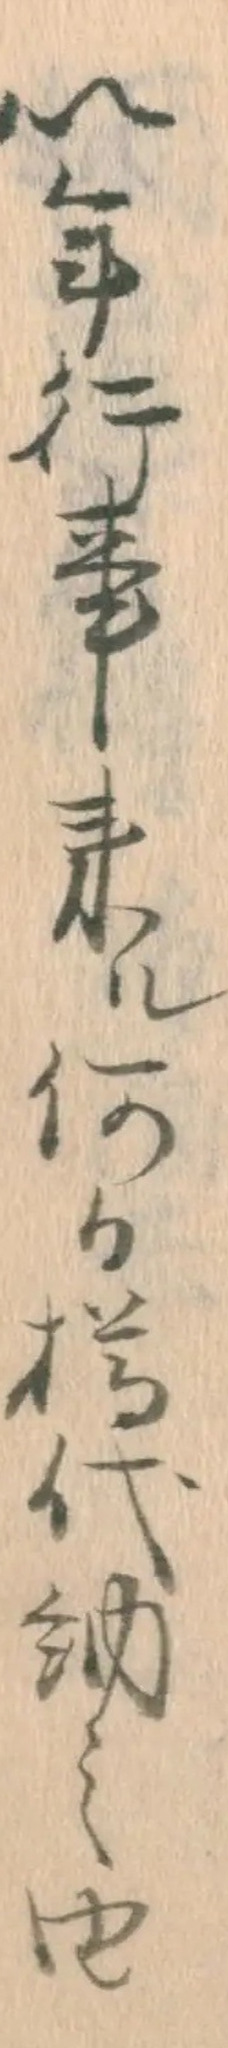以年月行事来ル何日樽代納之由
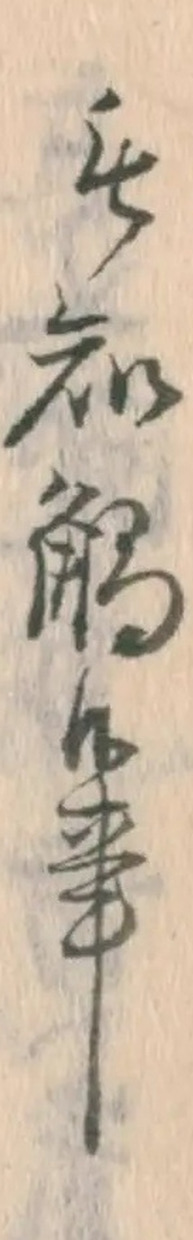も知触候事
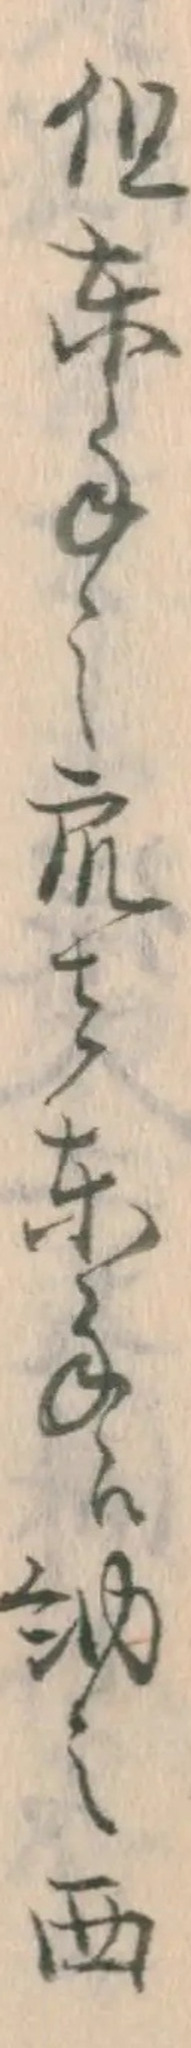但東手之衆は東手え納之西
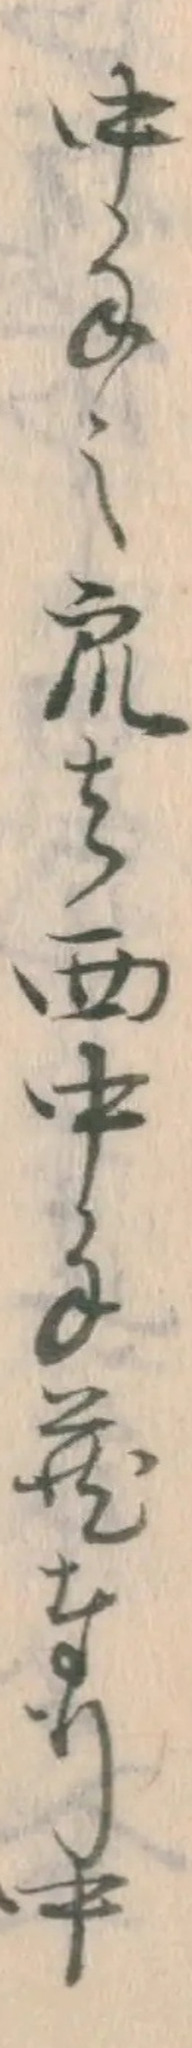中手之衆は西中手蔵奉行中
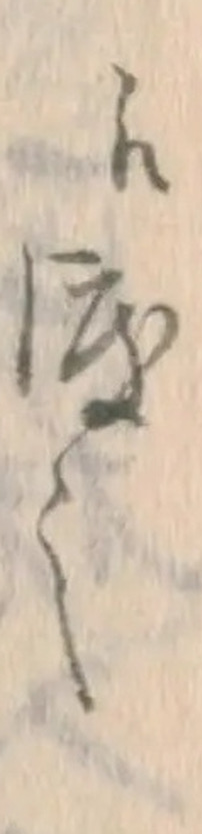え渡也
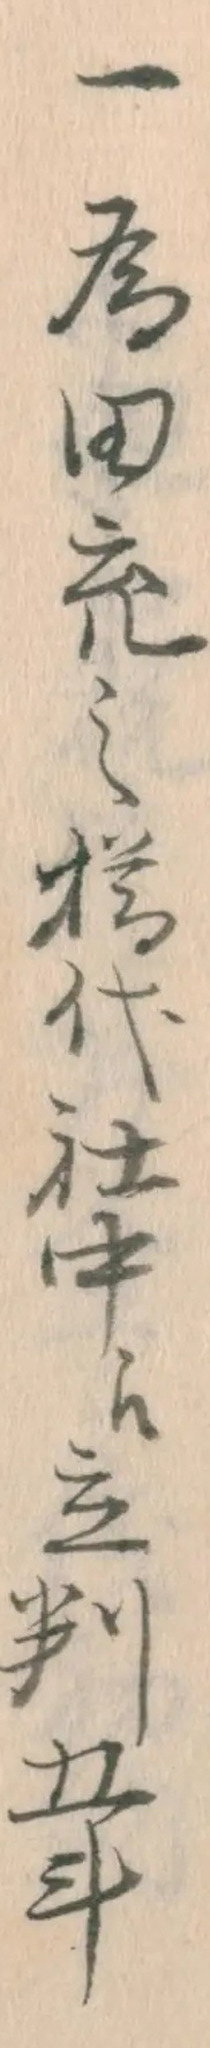一為田充之樽代社中え立判五斗
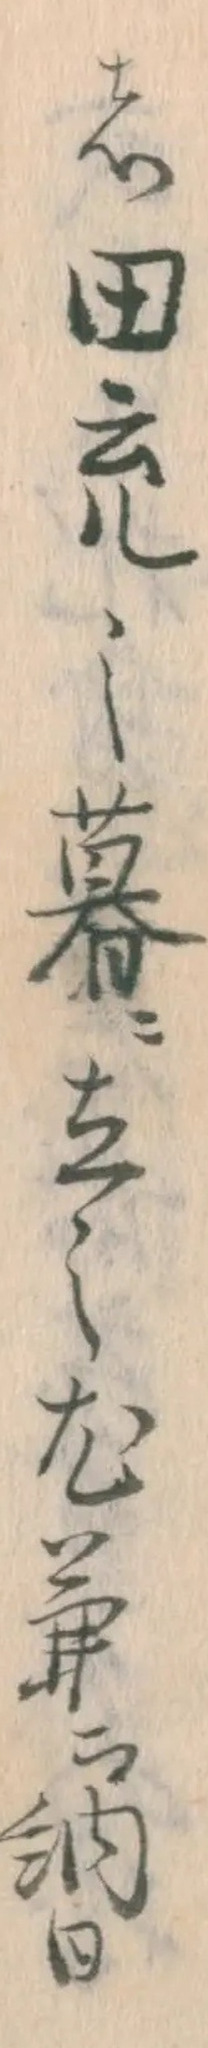は田宛之暮ニ立也尤兼而納日
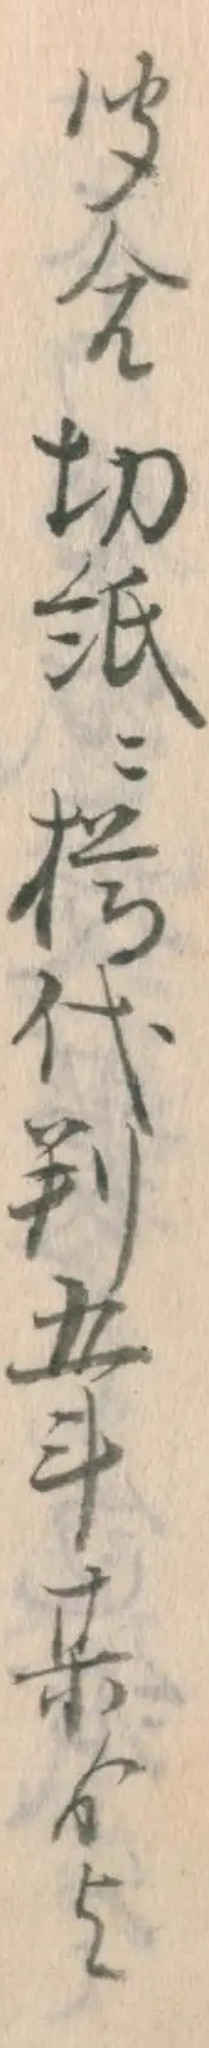聞合切紙ニ樽代判五斗某ゟと
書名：賀茂社記録. 第81冊
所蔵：国立国会図書館 National Diet Library, JAPAN
